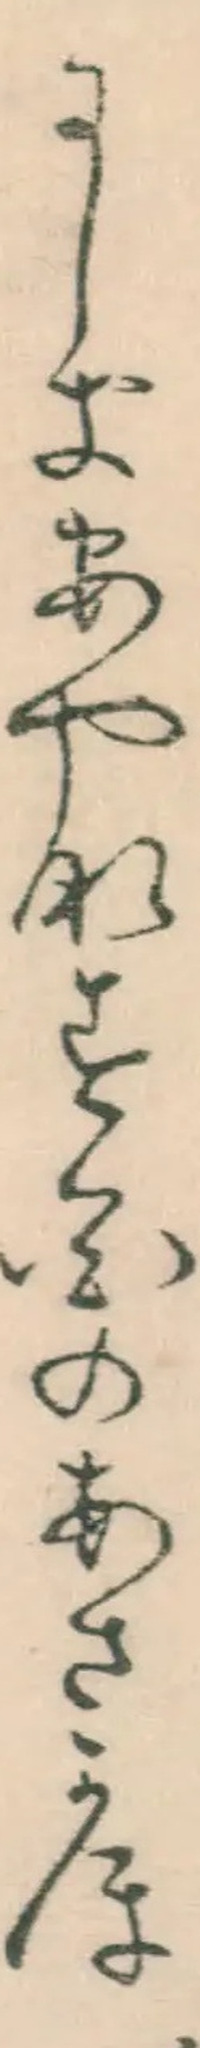にしきあやなす花のあさかほ蟹丸
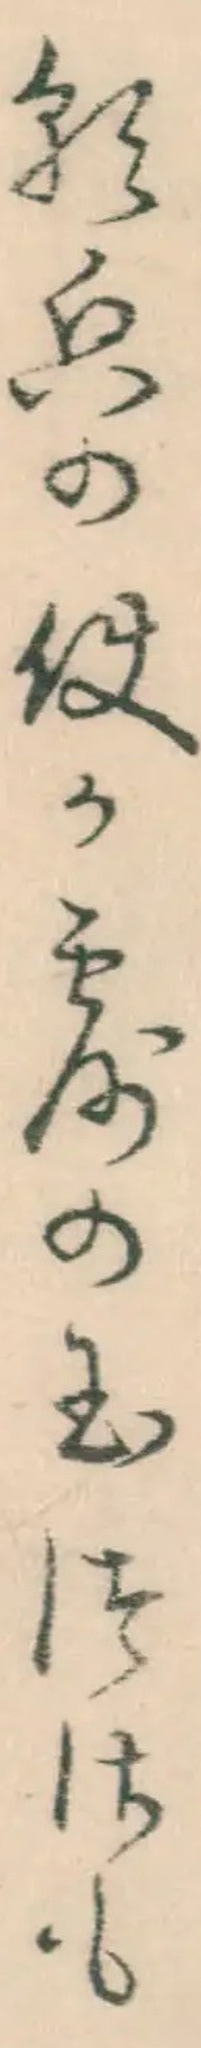朝皃のか露の玉つさも

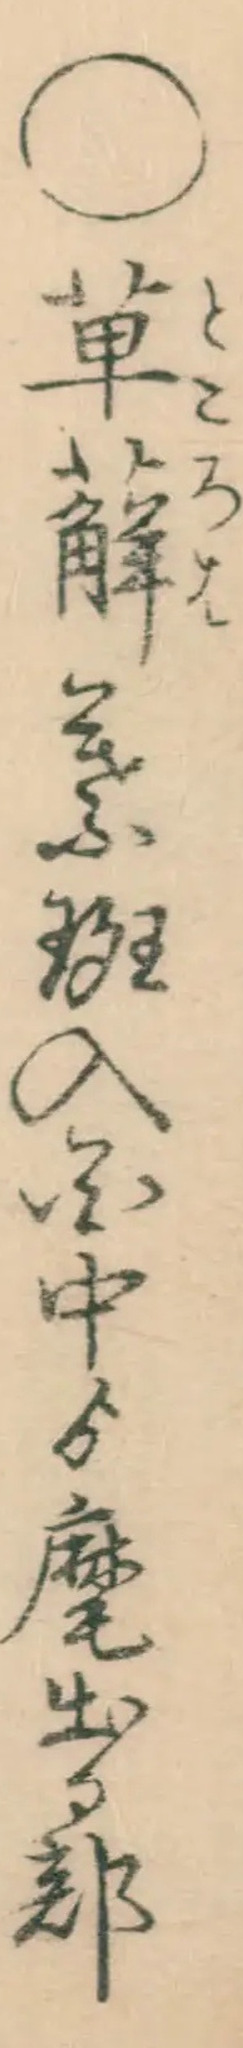○草薢葉斑入花中より麾出る部
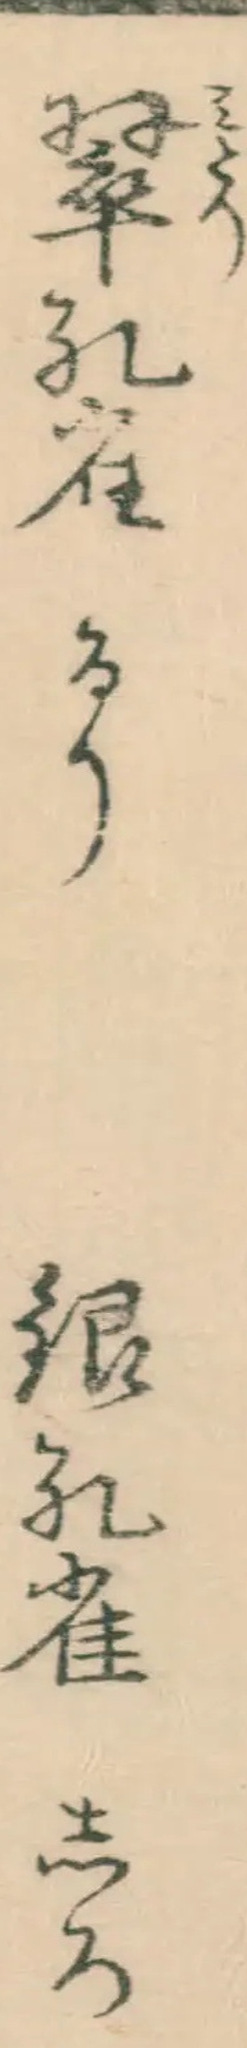翠孔雀るり銀孔雀しろ
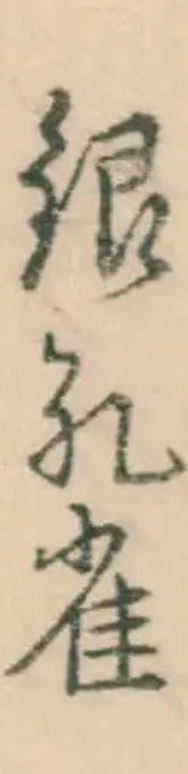翠孔雀
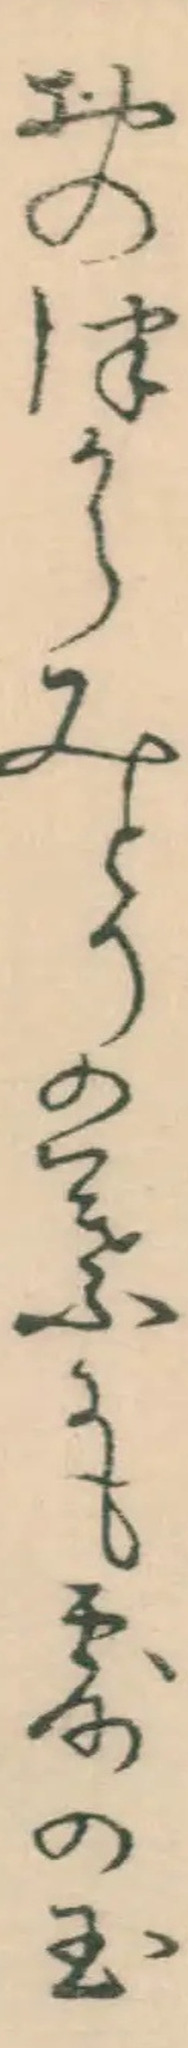おのつからみとりの葉にも露の玉
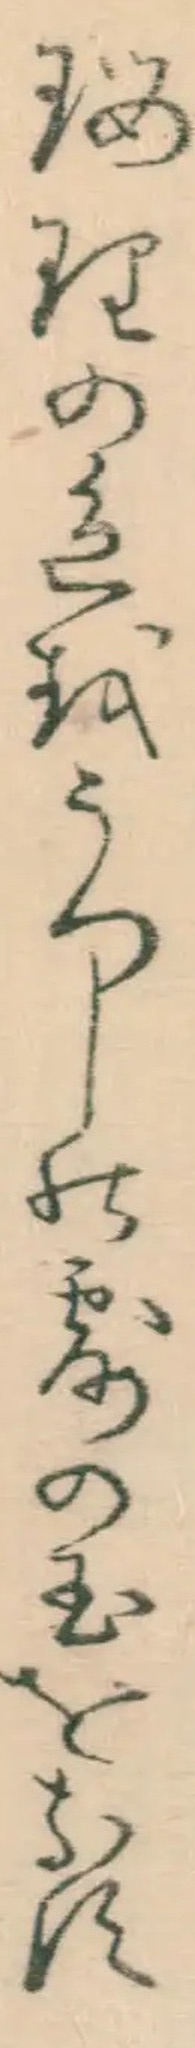瑠理の色をうつしの露の玉をなす
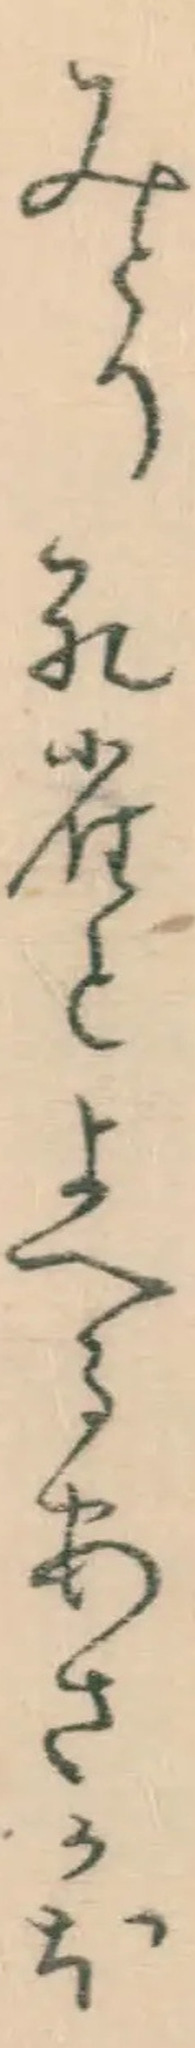みとり孔雀とよへるあさかほ冬丸
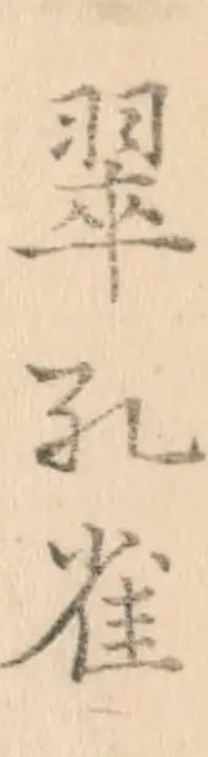翠孔雀

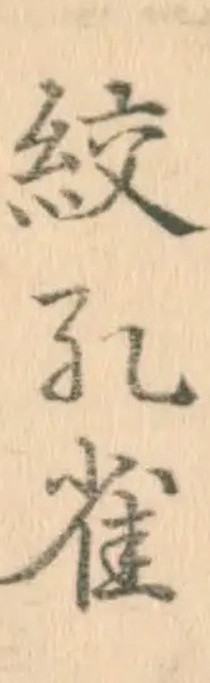絞孔雀
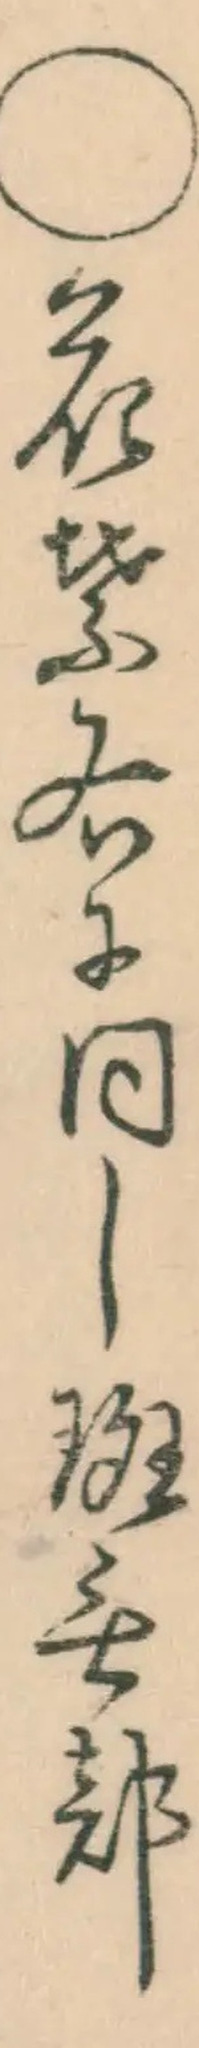○花葉右に同し斑無部

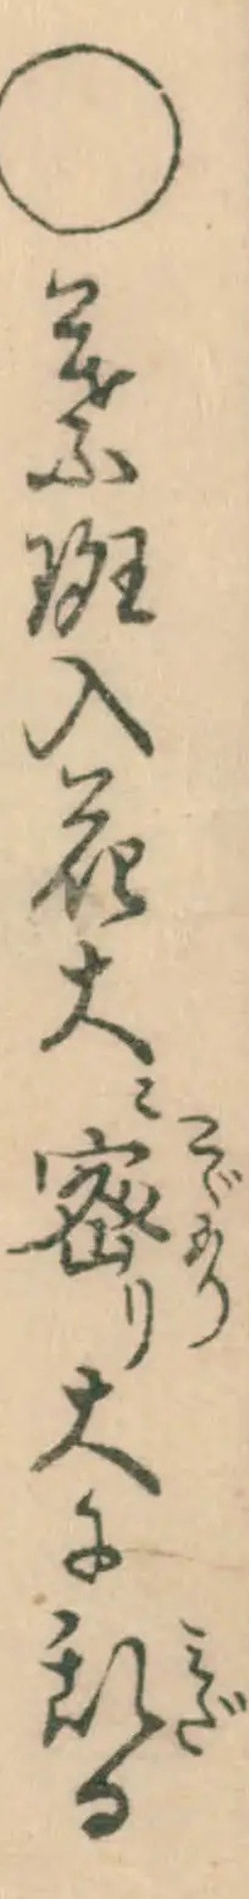○葉斑入花大に密り大に乱る
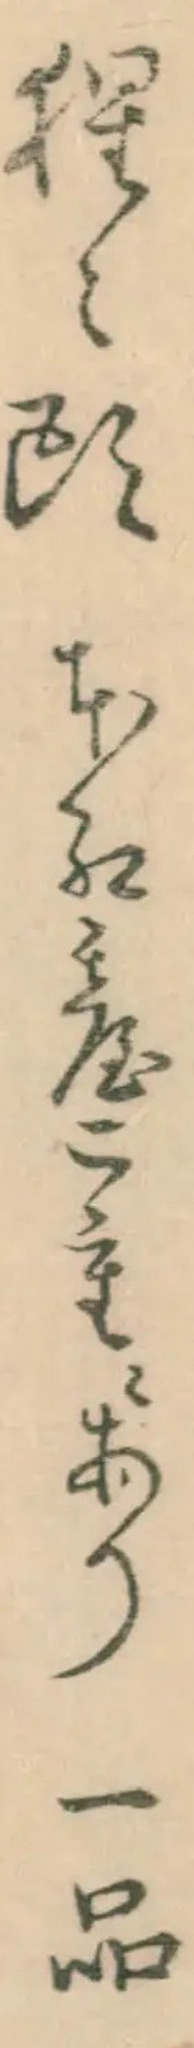猩々頭本紅台二重にあり一品
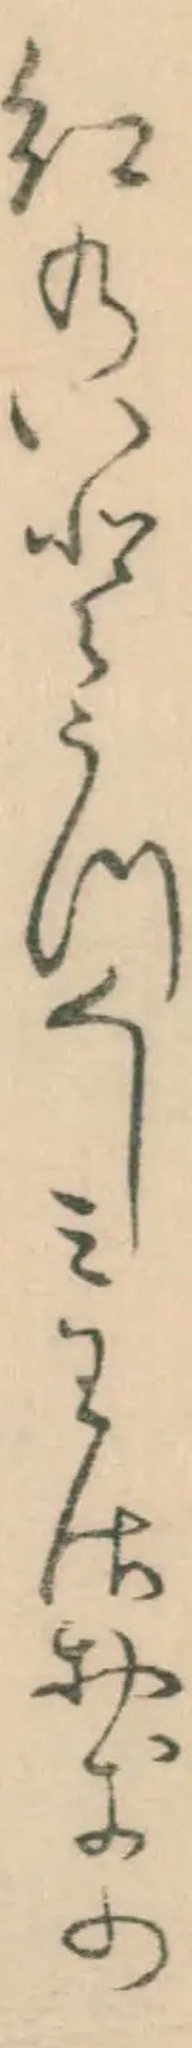紅のいとうつくしみわさおきの
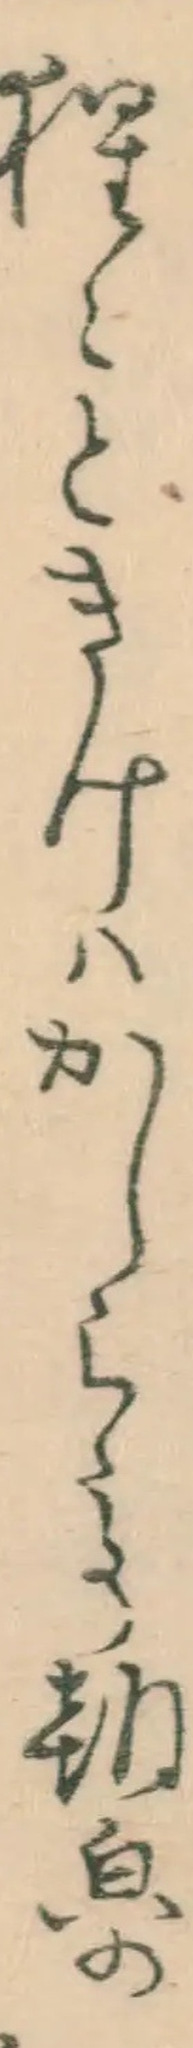猩々ときけはかしら朝皃の
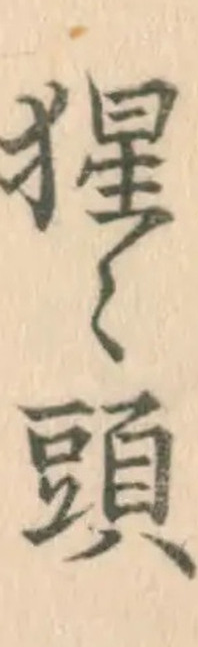猩々頭
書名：花壇朝顔通 2巻. [1]
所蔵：国立国会図書館 National Diet Library, JAPAN
